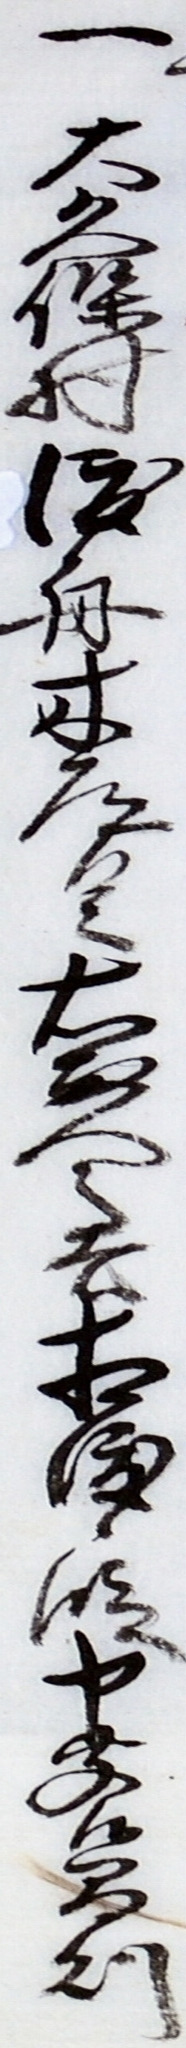一大久保村渡舟木道具右両人之者相渡候段申聞候間則
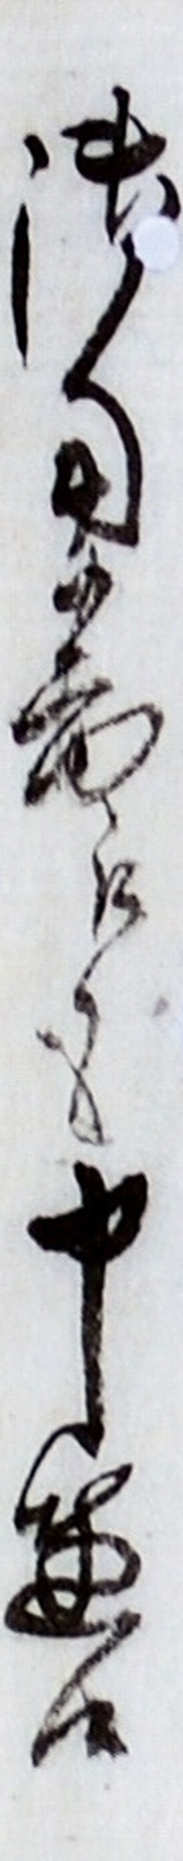御用番江も申達候
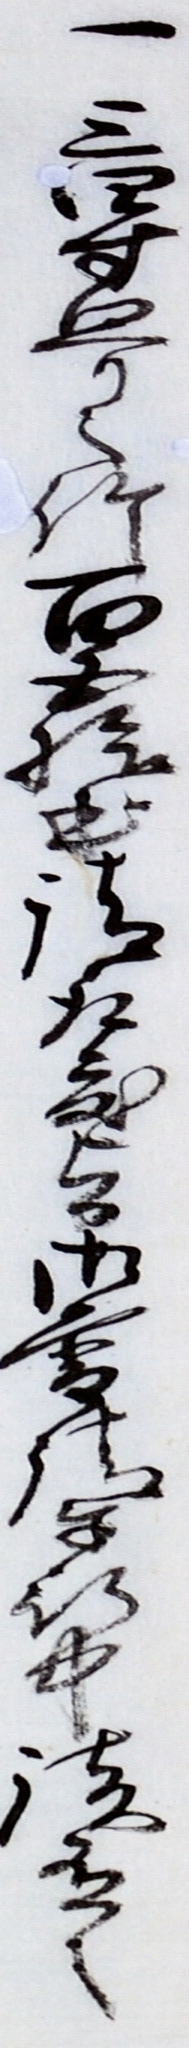一三四寸廻り之竹百五拾本請取度旨御普請奉行中談有之
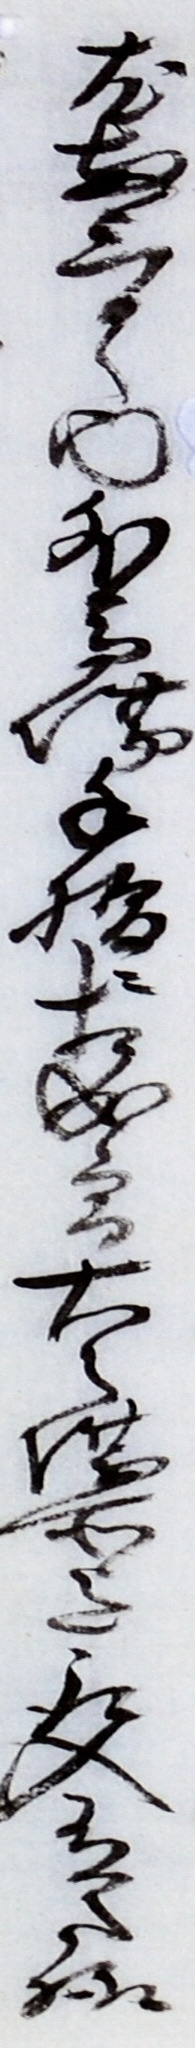尤両三日之内外馬場手橋ニ相成候間右之場所迄取入有之候様
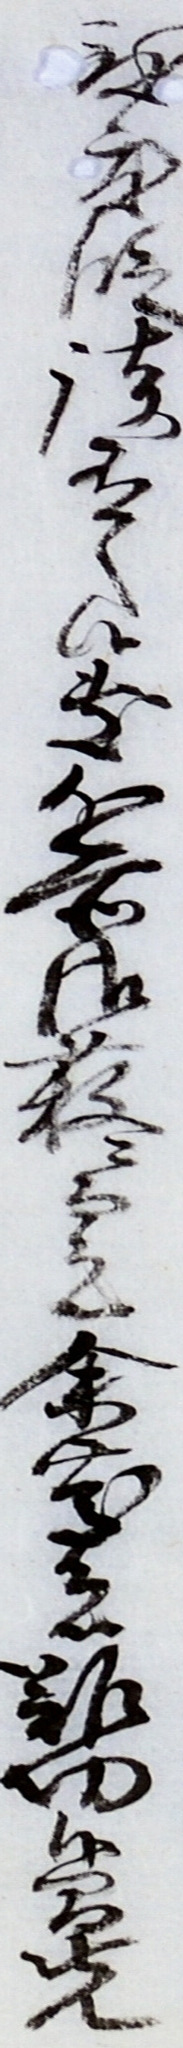致度段談有之候処近所御藪ニ而は余処は難切候間先
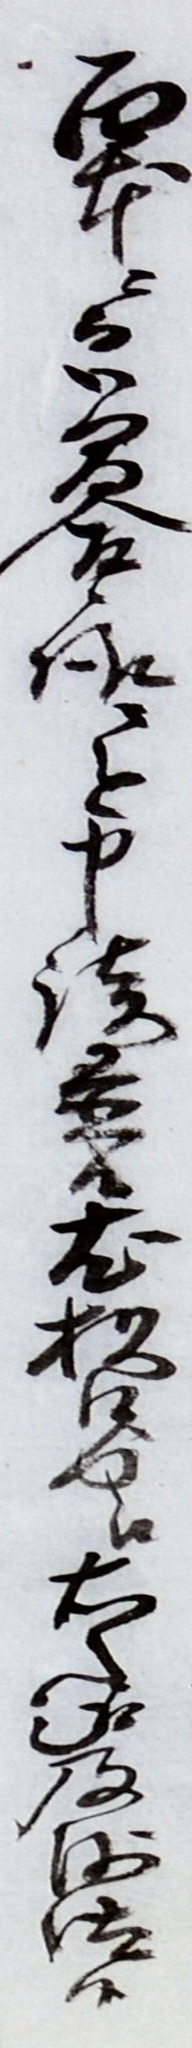百本ニ而御間合候様ニと申談置候尤杉左衛門江右之趣及沙汰候
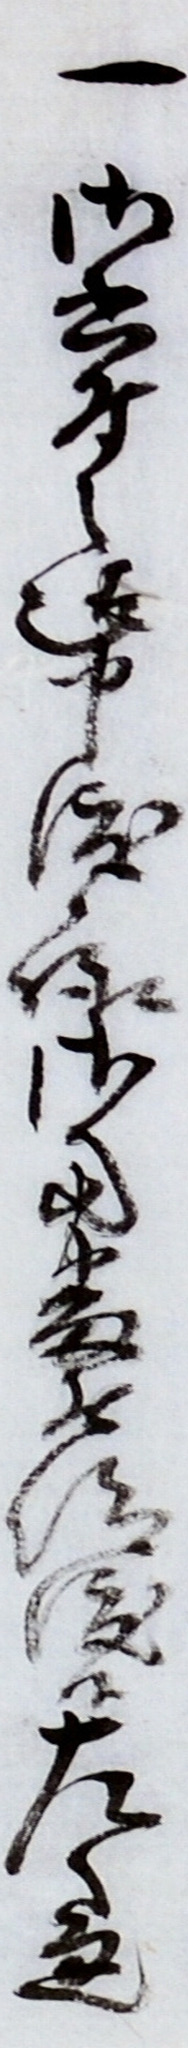一御書付之趣申渡候様御用番被仰渡候左之通
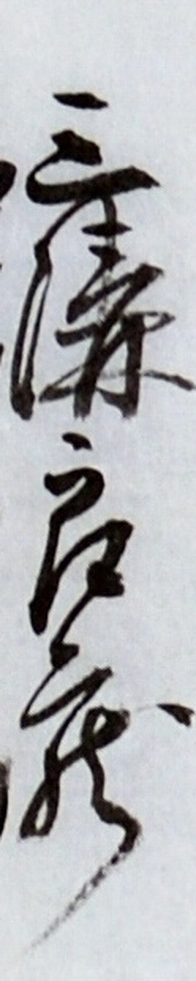三溝良蔵
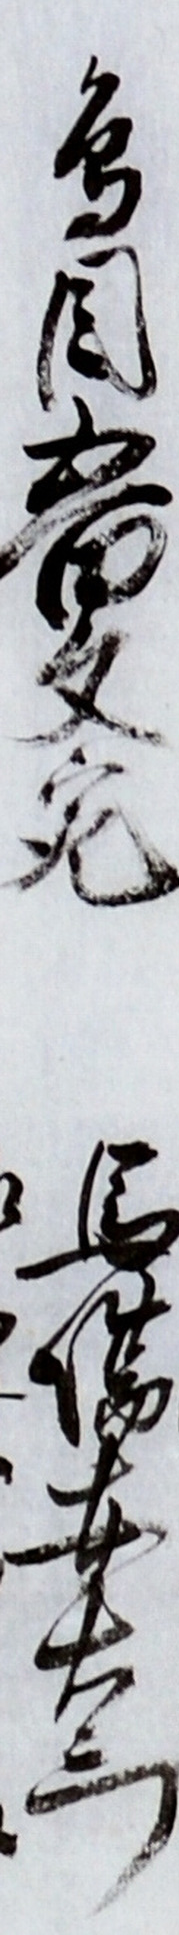鳥目五百文宛馬場安右衛門
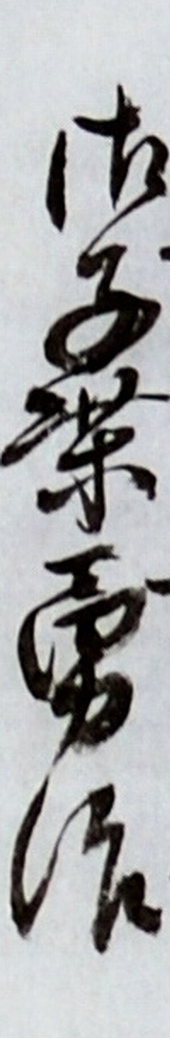御子柴勇治
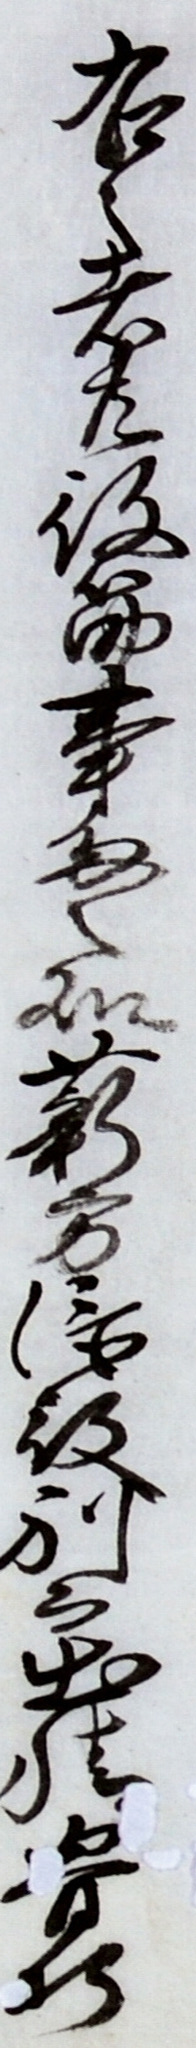右之者共役筋事多之処薪方添役別而出精骨折
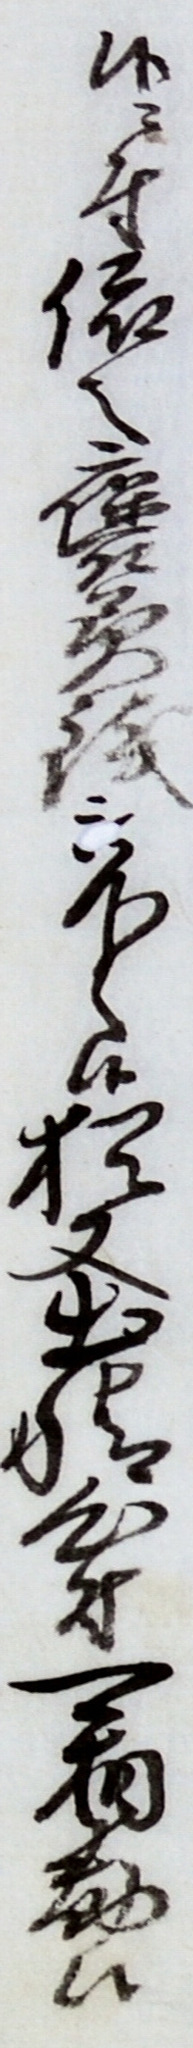候ニ付依之褒美銭被下之候猶又出精心付可相勤候

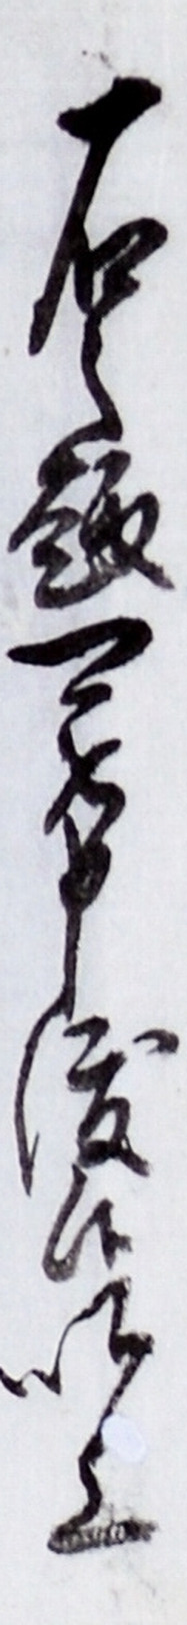右之趣可被申渡候以上
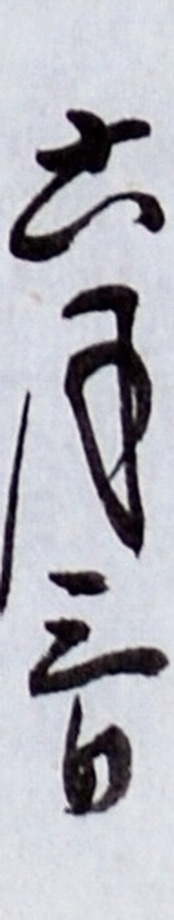六月三日
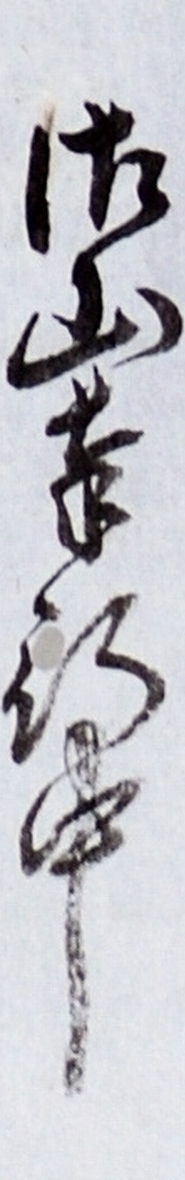御山奉行中
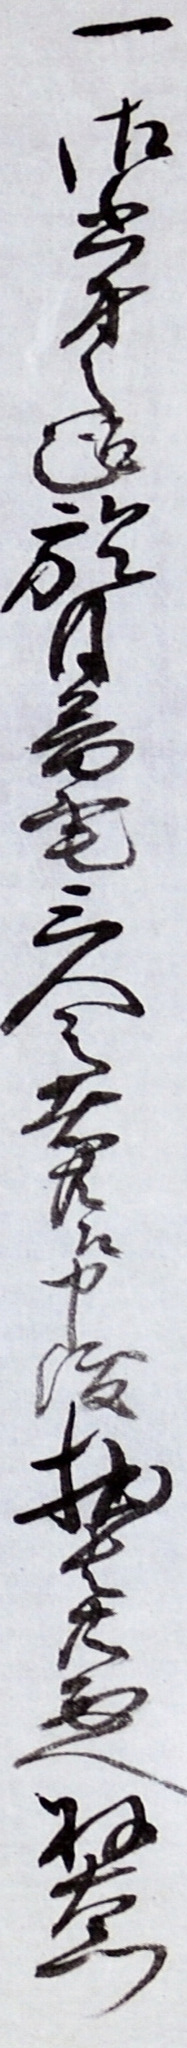一御書付之趣於月番宅三人之者共江申渡拙者共両人羽右衛門
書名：御山奉行御用控
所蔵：伊那市立高遠町図書館・合同会社AMANE
